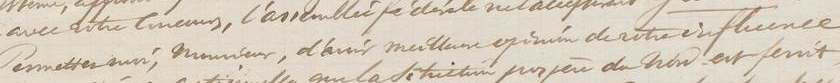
Permettez-moi, Monsieur, d'avoir meilleure opinion de votre influence
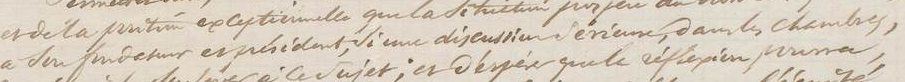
a son fondateur et président, si une discussion sérieuse, dans les chambres,
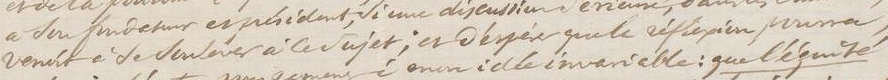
venait à se soulever à ce sujet; et d'espérer que la réflexion pourra,
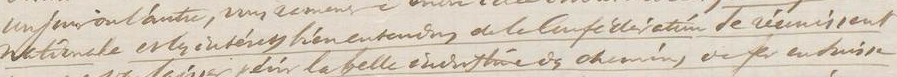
matinale et ces intérets bien entendus de la confédération se réunissent
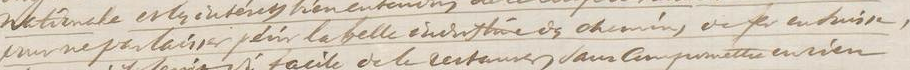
pour ne pas laisser périr la belle industrie des chemins de fer en Suisse,
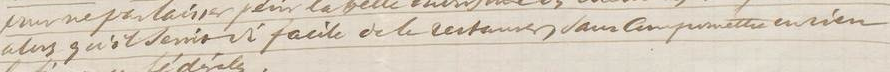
alors qu'il serait si facile de le retrouver sans compromettre en rien
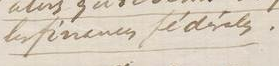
les finances fédérales.
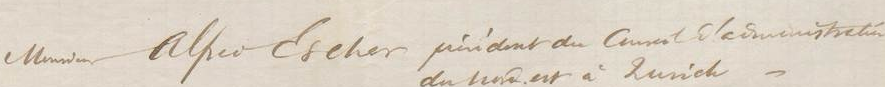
Monsieur Alfred Escher président du Conseil d'administration
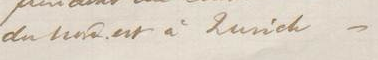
du Nord-est à Zurich –
